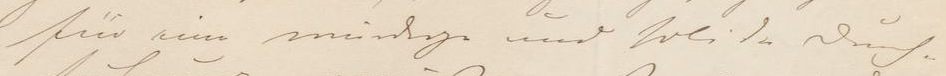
für eine würdige und solide Durch-
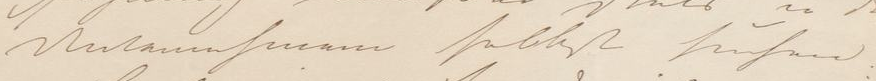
Unternehmen selbst suchen.
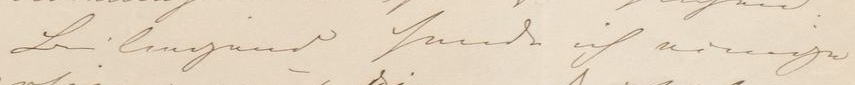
Beiliegend sende ich einige
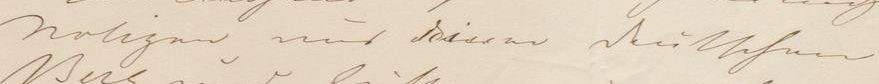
Notizen aus einer deutschen
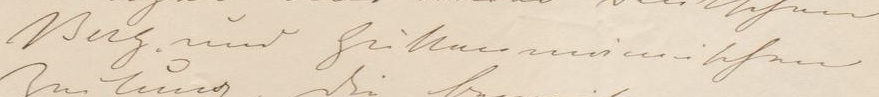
Berg- und Hüttenmännischen
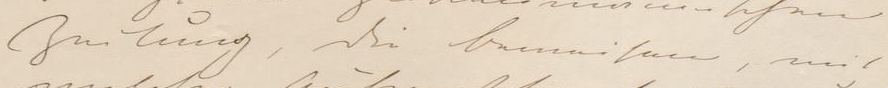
Zeitung, die beweisen, mit
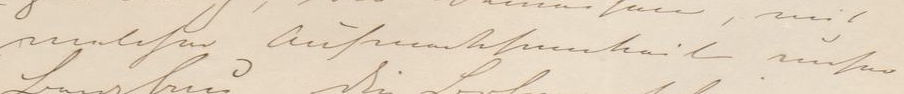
welcher Aufmerksamkeit unser
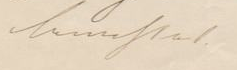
beachtet.
